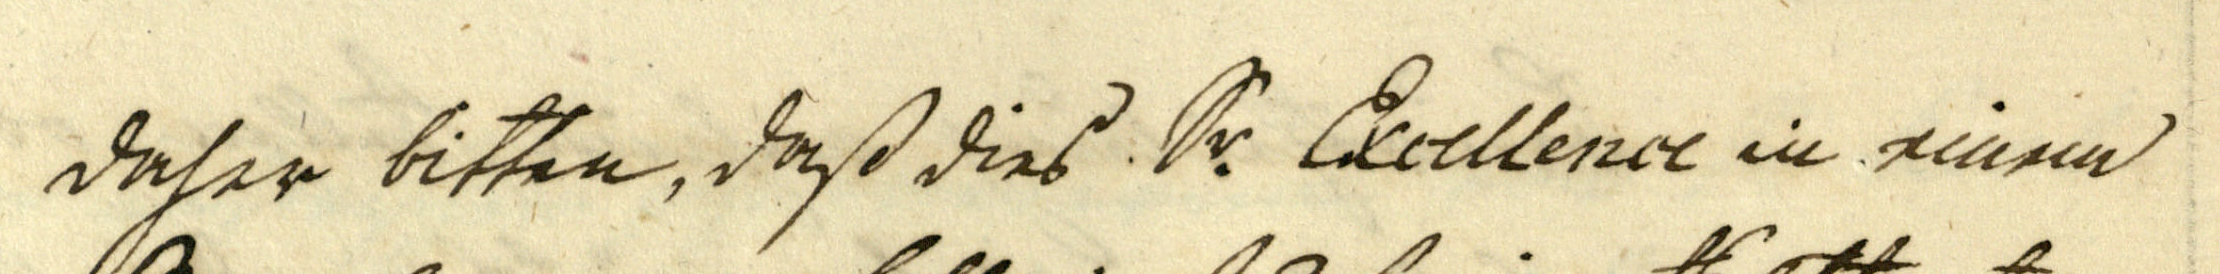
daher bitten, daß dies Sr Excellence in einem
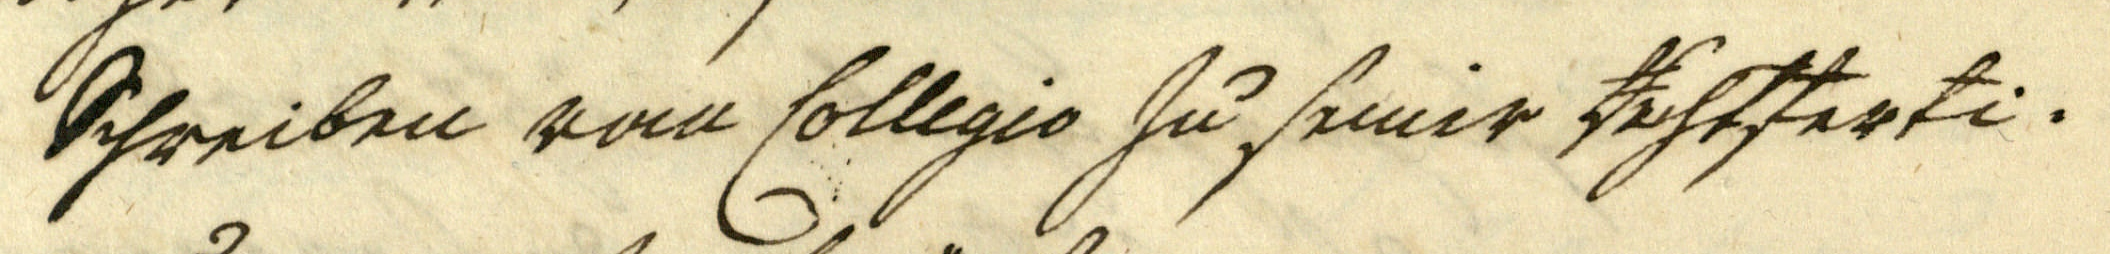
Schreiben vom Collegio zu seiner Rechtferti¬
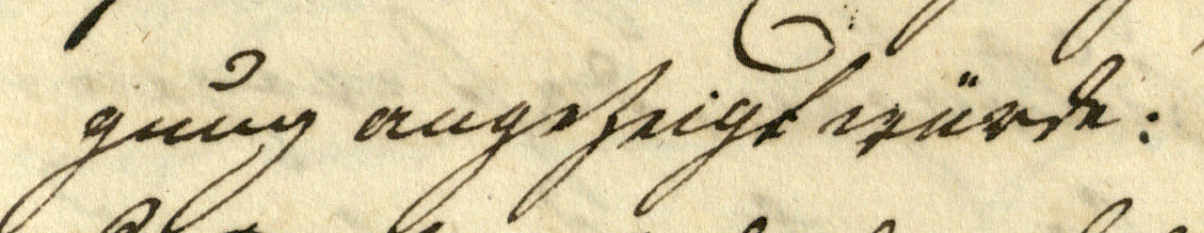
gung angezeigt würde:
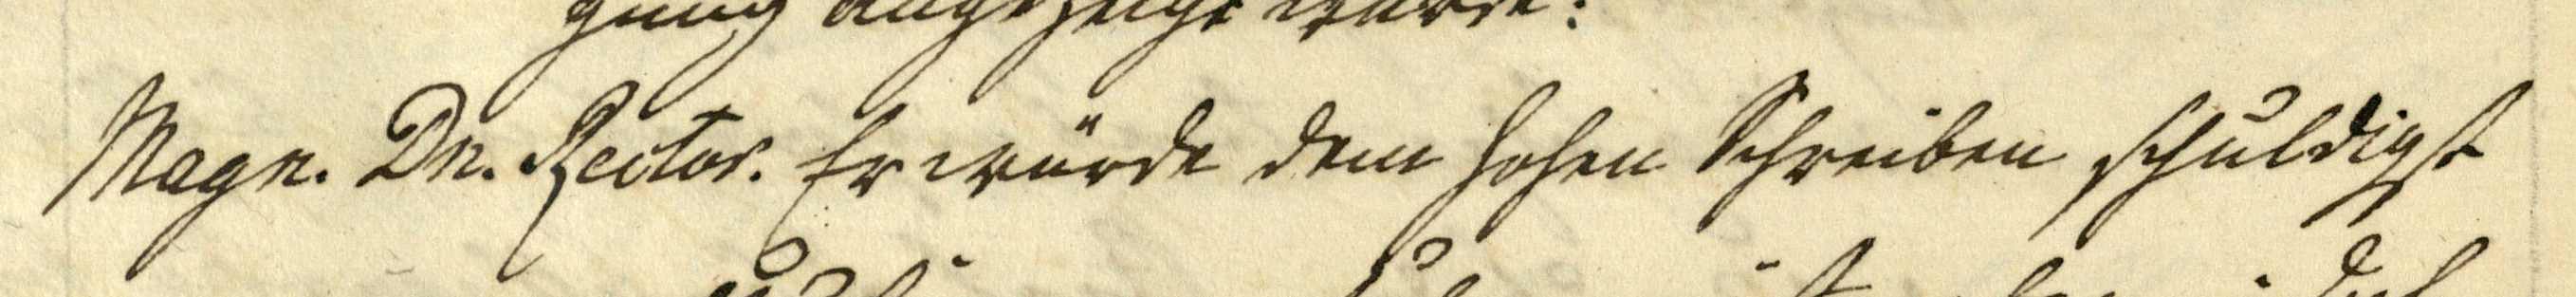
Magn. Dn. Rector. Er würde dem hohen Schreiben schuldigst
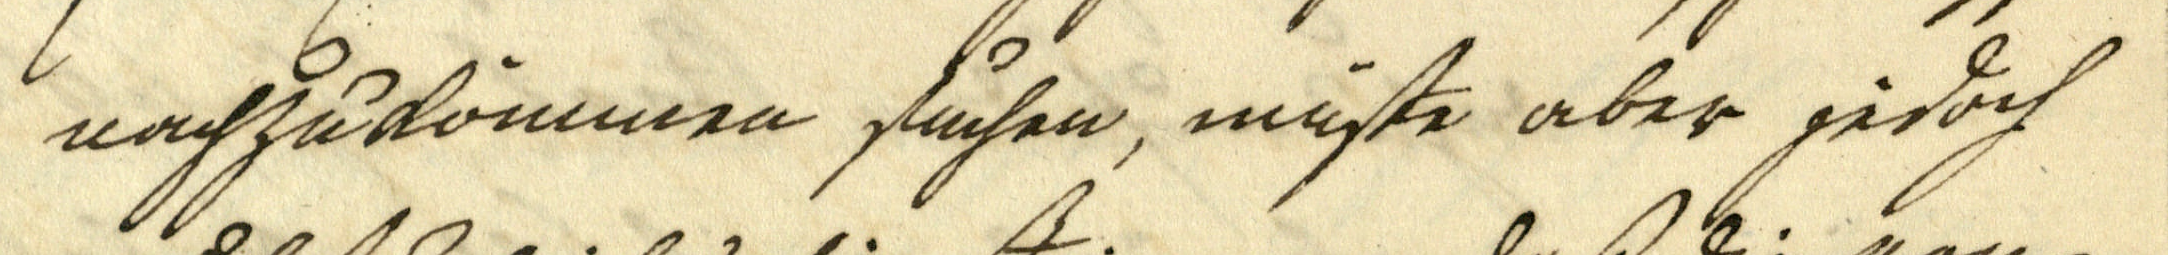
nachzukommen suchen, müßte aber jedoch
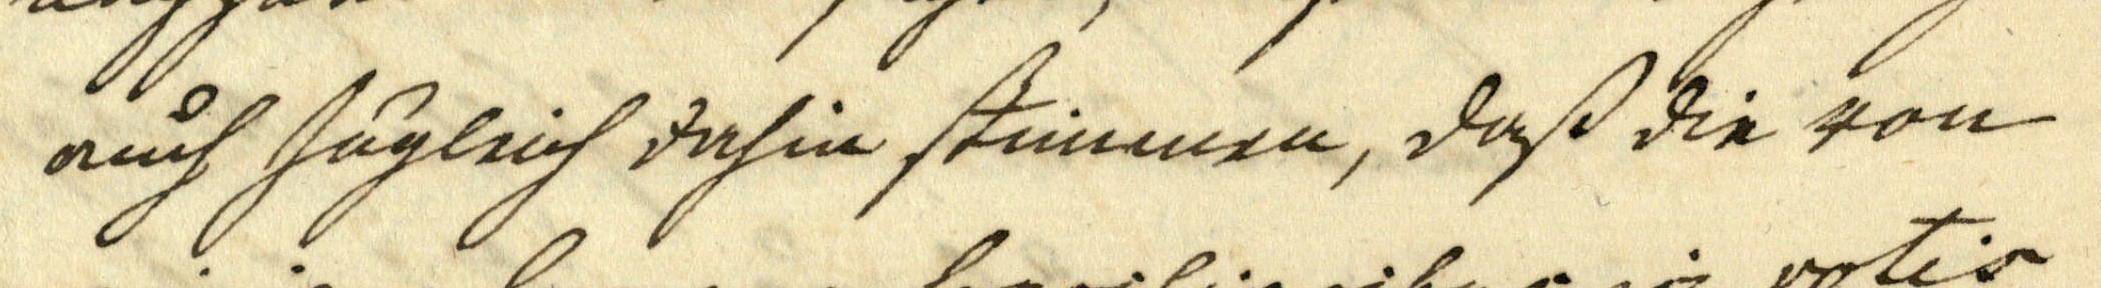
auch zugleich dahin stimmen, daß die von
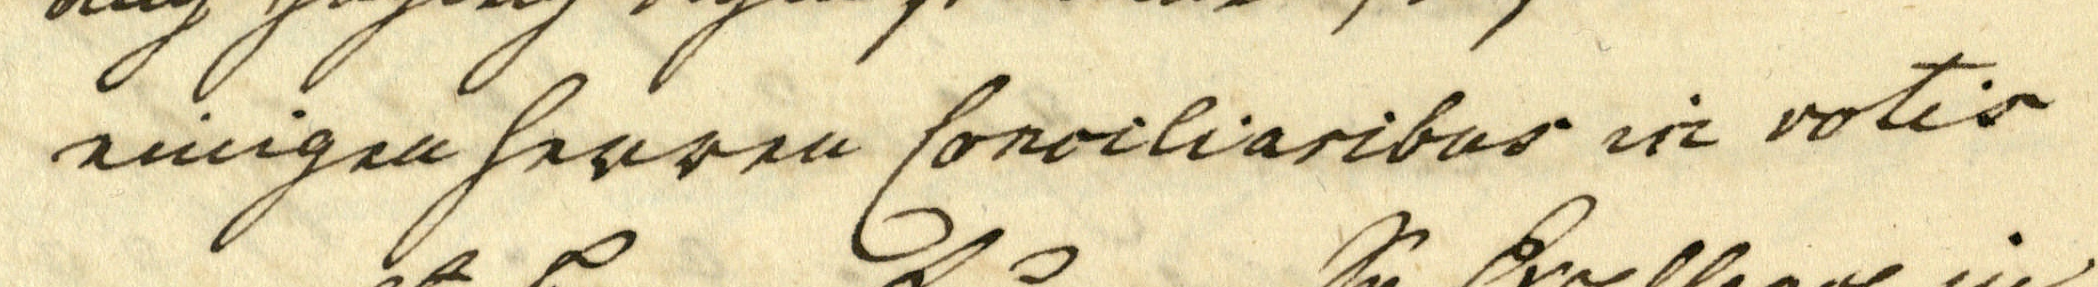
einigen Herren Conciliaribus in votis
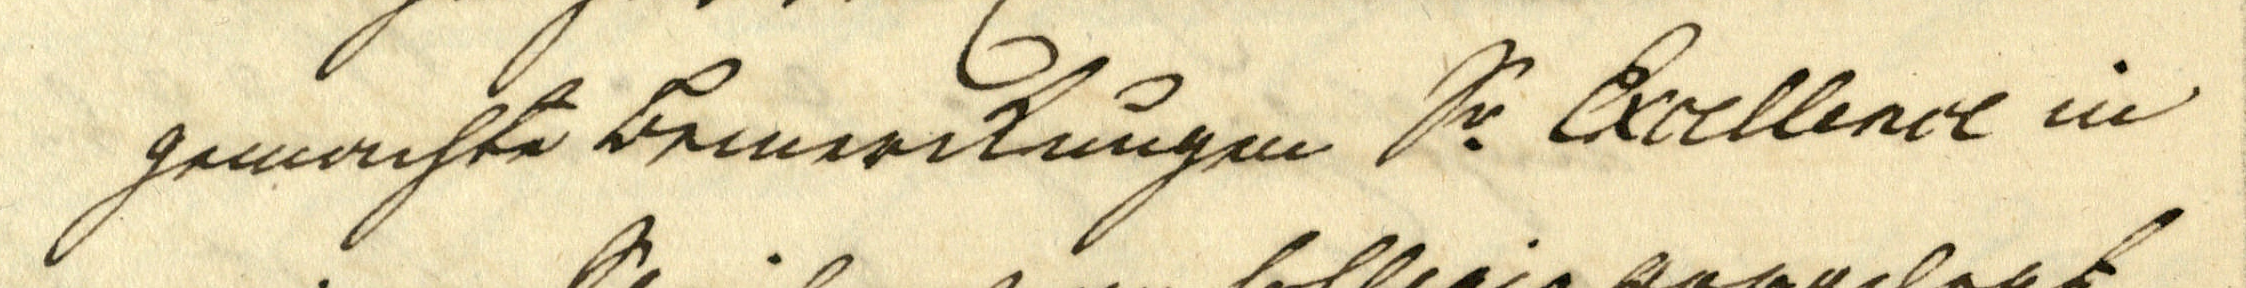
gemachte Bemerckungen Sr Excellence in
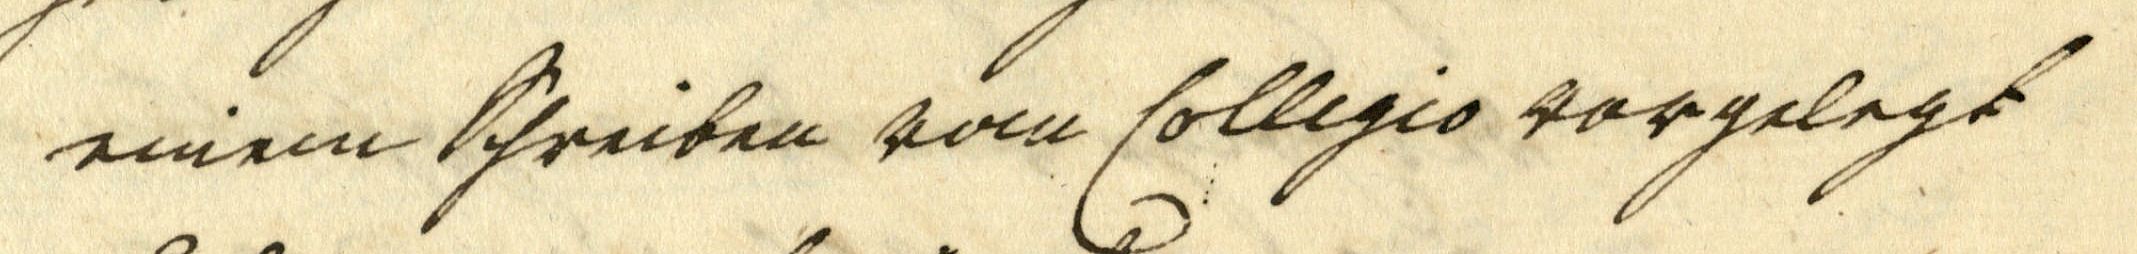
einem Schreiben vom Collegio vorgelegt
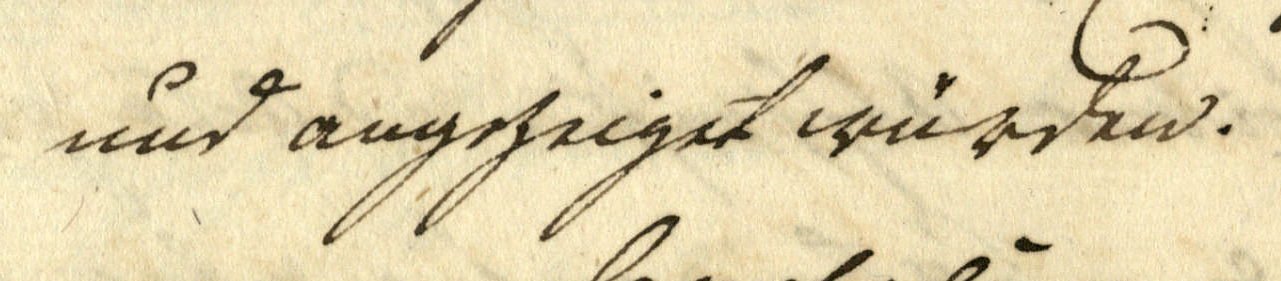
und angezeiget würden.
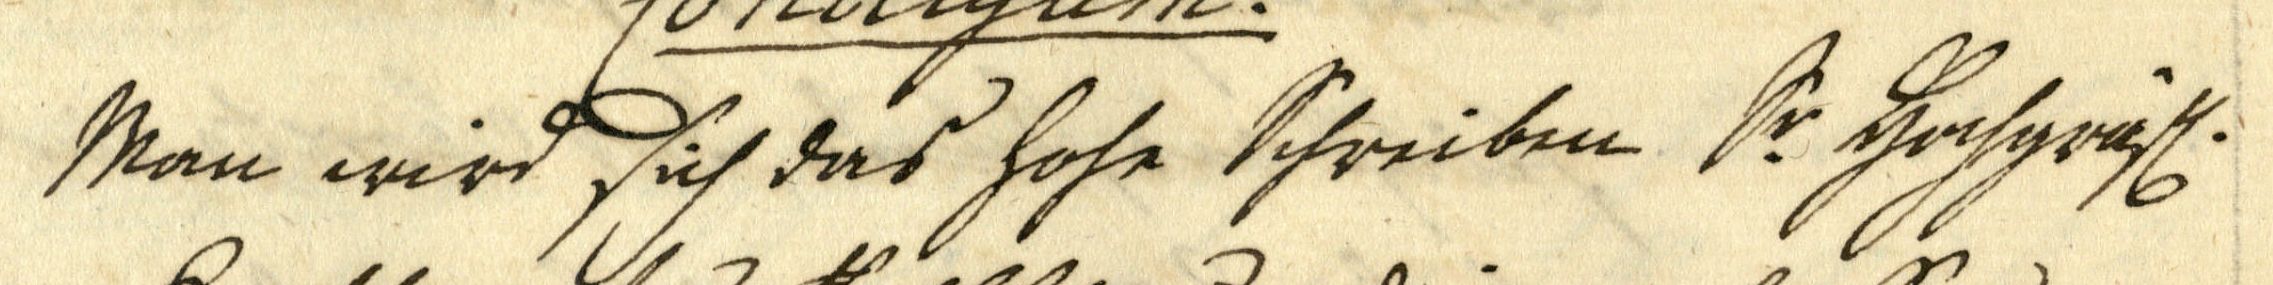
Man wird sich das hohe Schreiben Sr Hochgräfl.
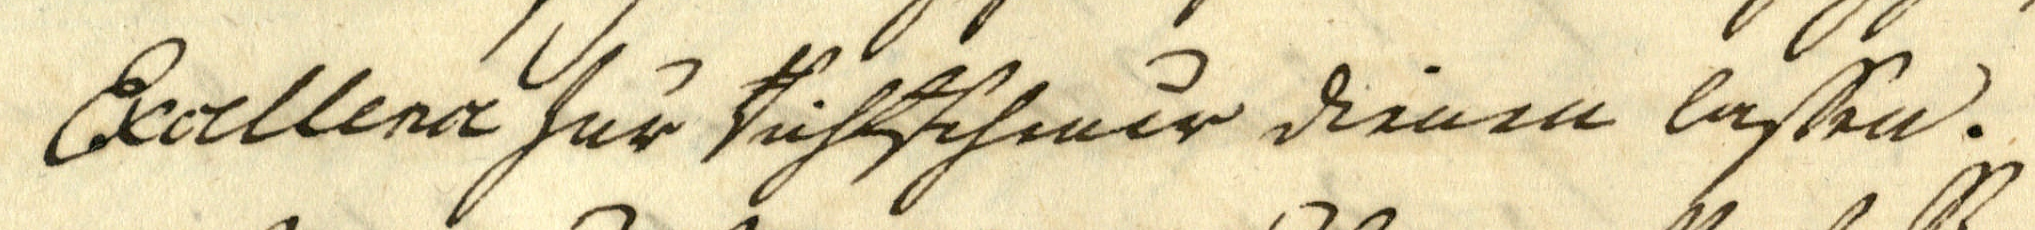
Excellence zur Richtschnur dienen lassen.
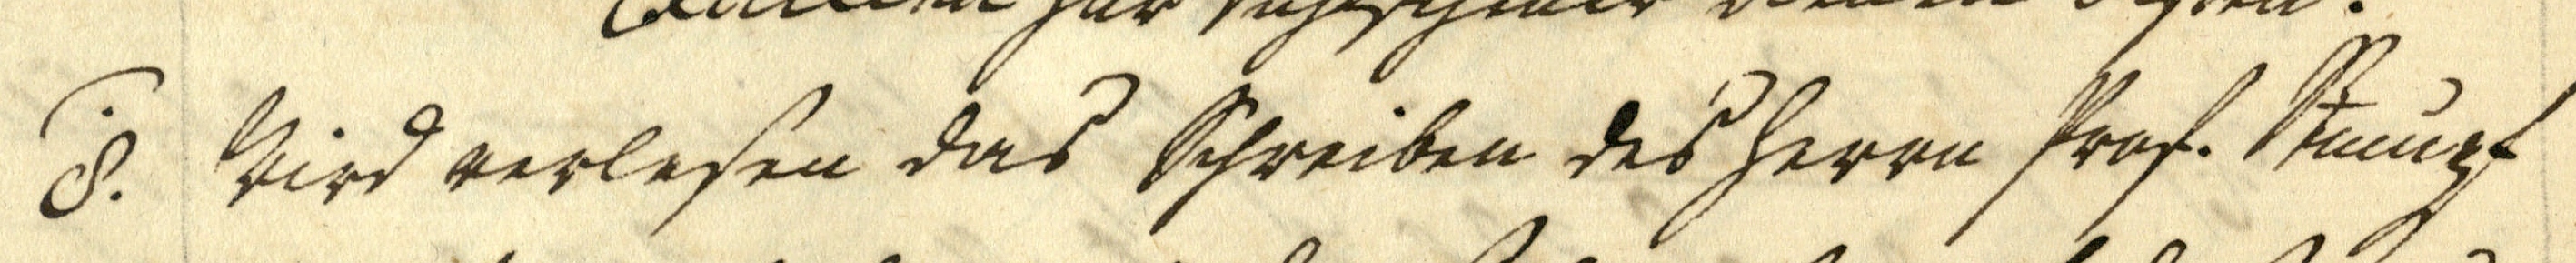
8. Wird verlesen das Schreiben des Herrn Prof. Stumpf
